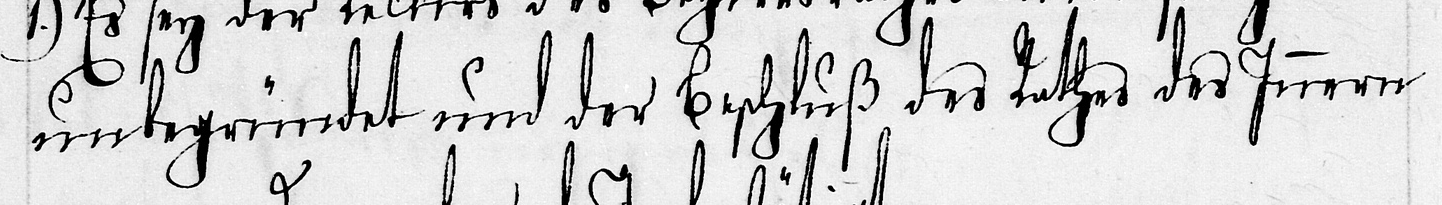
unbegründet und der Beschluß des Rathes des Innern
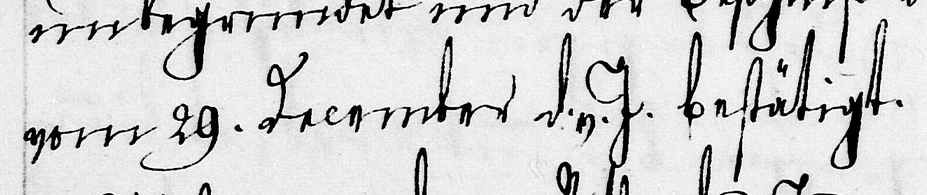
vom 29. September d. v. J. bestätigt.
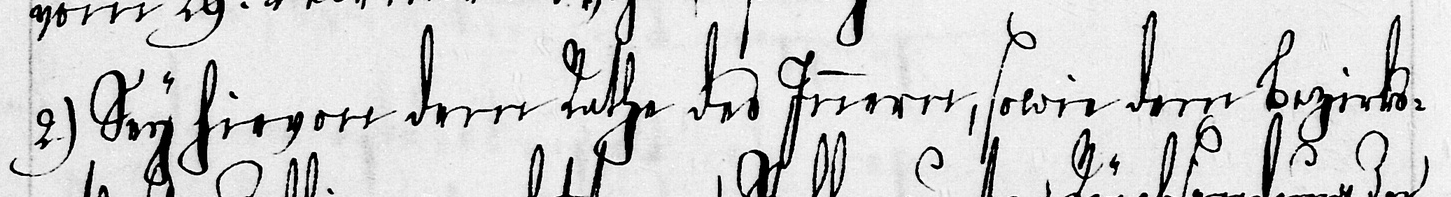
2.) Sey hievon dem Rathe des Innern, sowie dem Bezirks¬
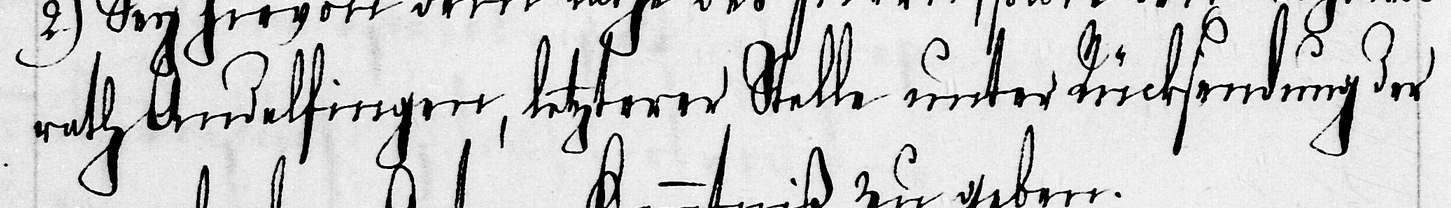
rath Andelfingen, letzterer Stelle unter Rücksendung der
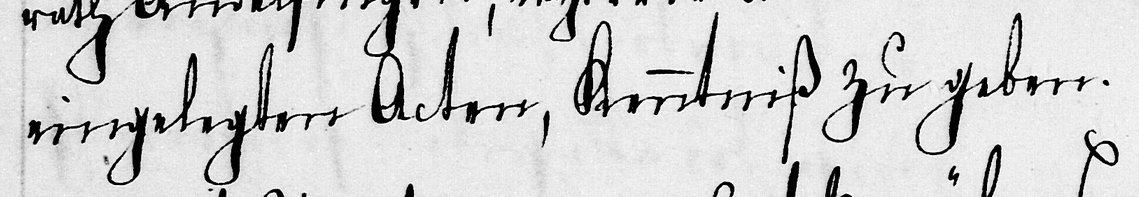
eingelegten Acten, Kenntniß zu geben.
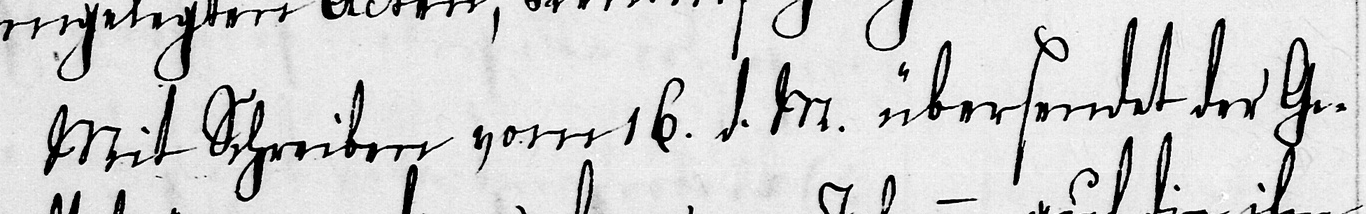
Mit Schreiben vom 16. d. M. übersendet der Ge¬
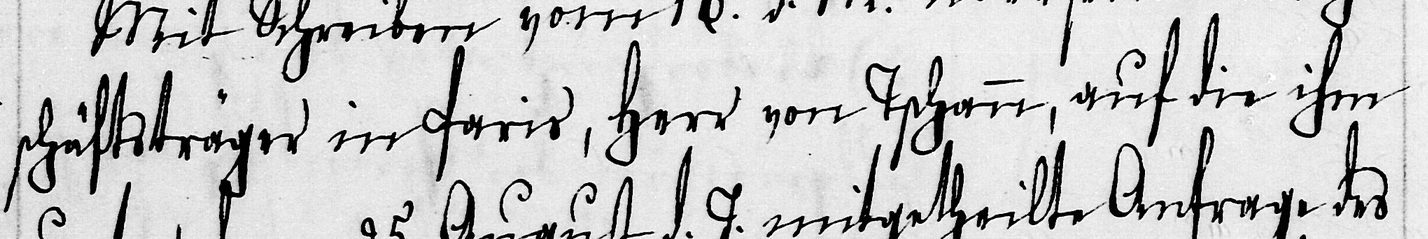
schäftsträger in Paris, Herr von Tschann, auf die ihm
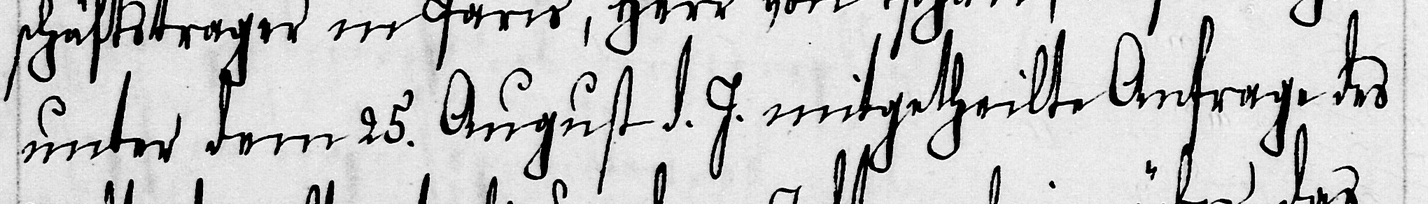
unter dem 25. August d. J. mitgetheilte Anfrage des
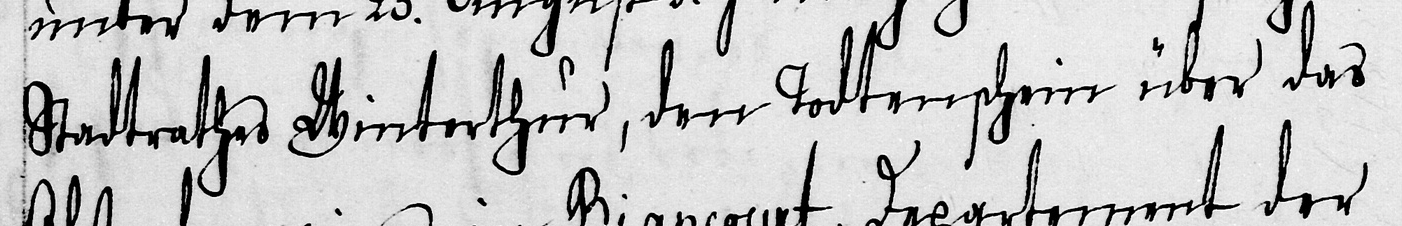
Stadtrathes Winterthur, den Todtenschein über das
